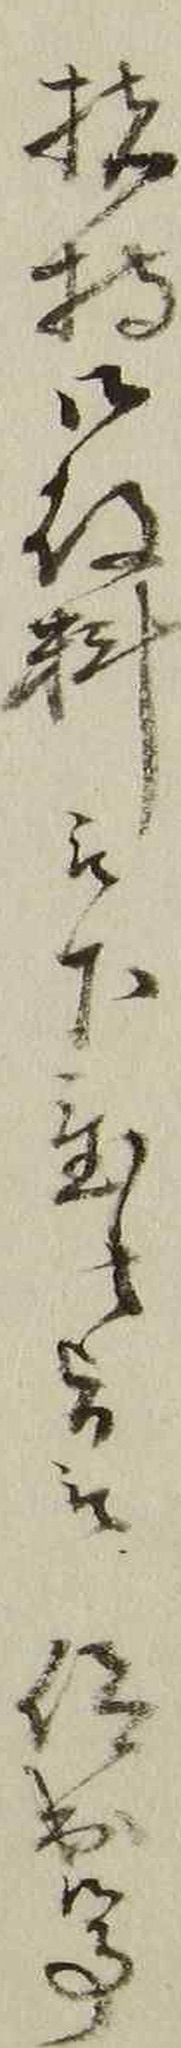扶持御役料被下置之旨被仰出候事
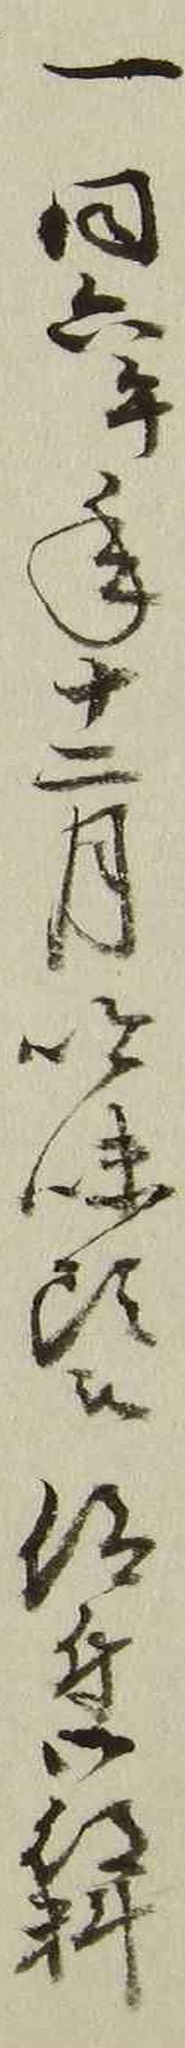一同六午年十二月吟味頭被仰付御役料
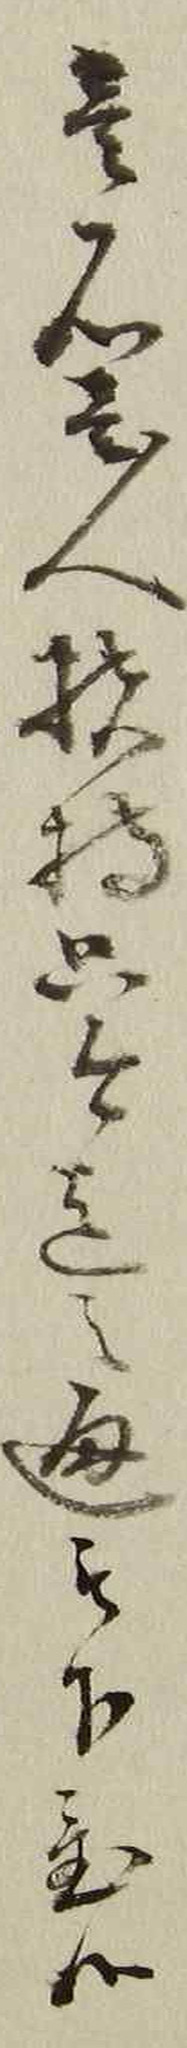壱石壱人扶持只今迄之通被下置候
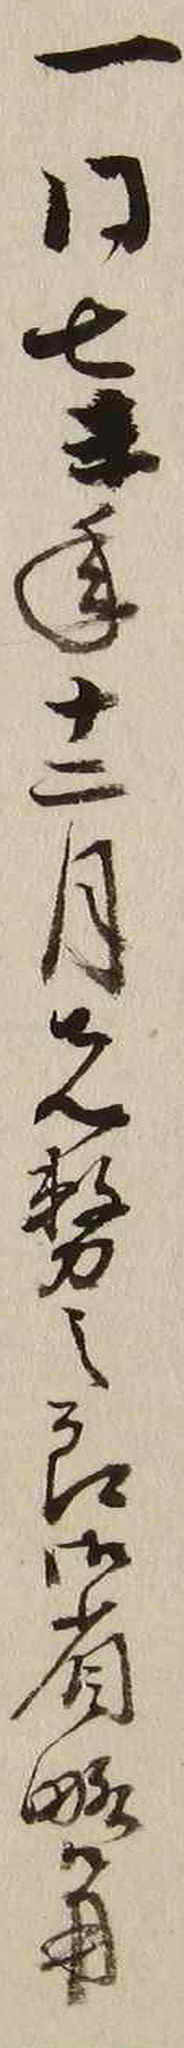一同七未年十二月先務之節御省略御用
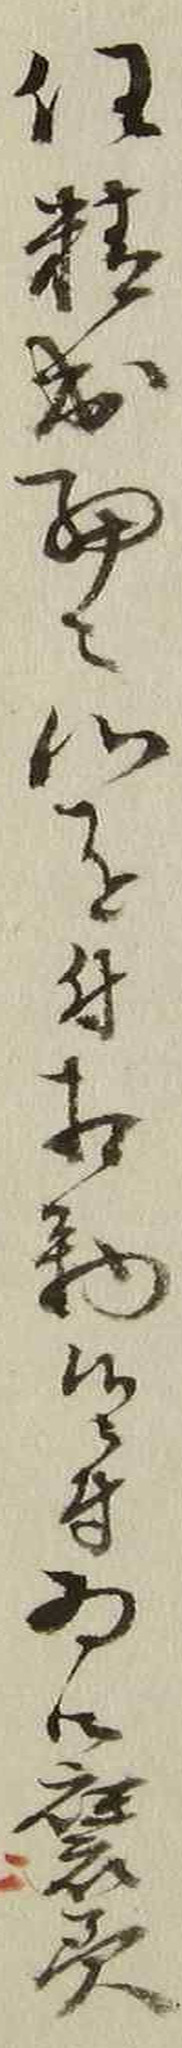任精出細々心を付相勤候ニ付為御褒美
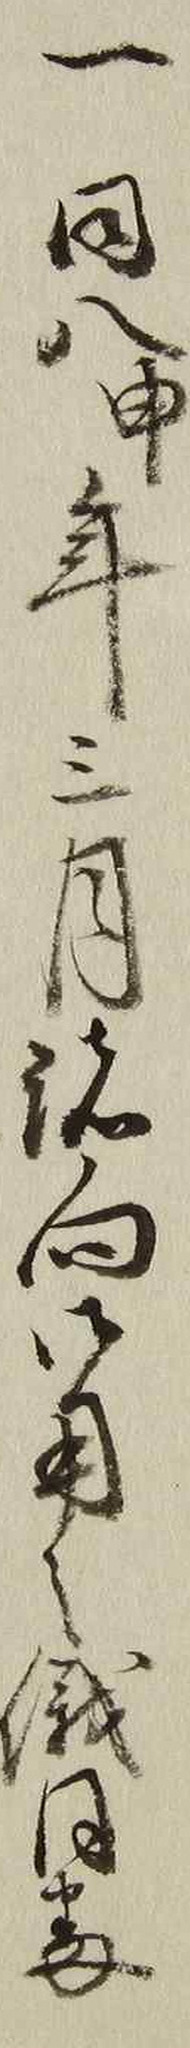一同八申年三月諸向御用之儀同番
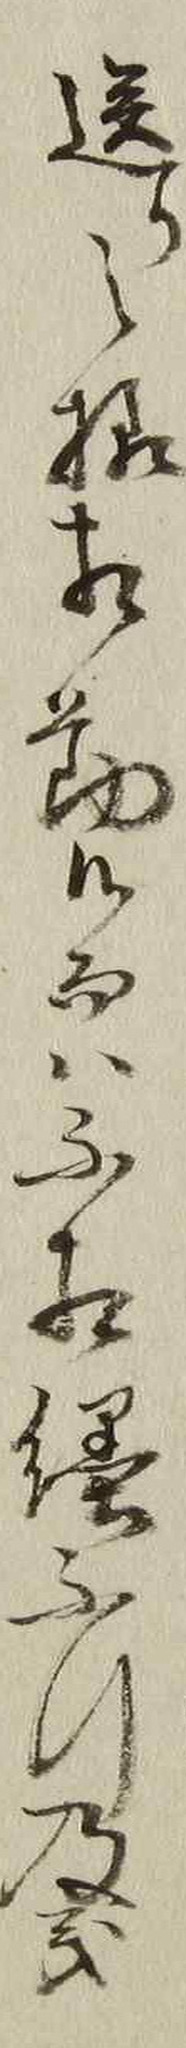送り之様相勤候而ハ不相纆不行及義
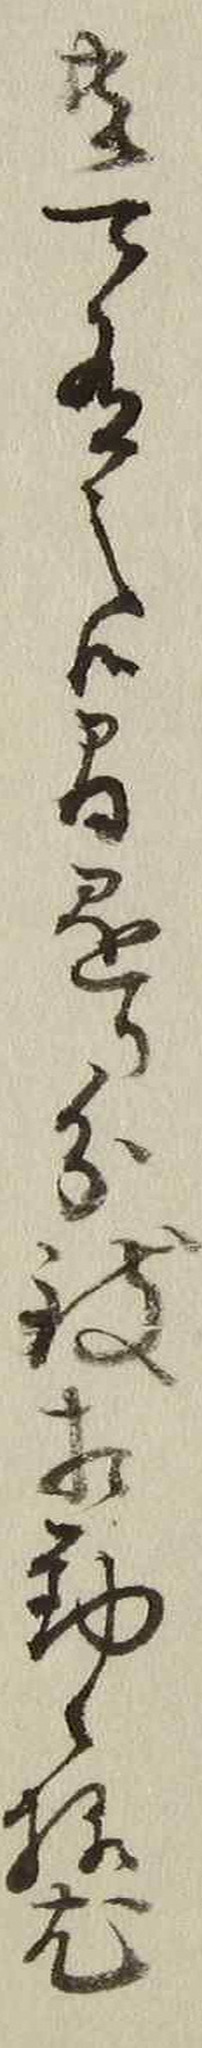共可有之候間懸り分致相勤候様尤
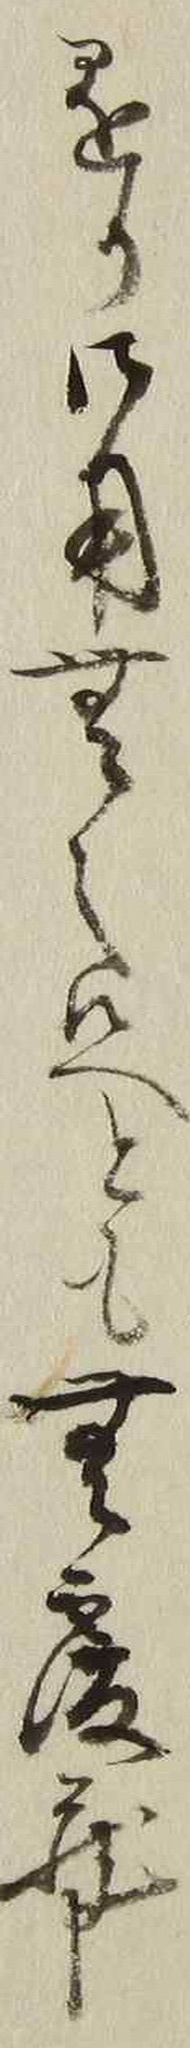懸り御用無之候へとも無覆蔵申
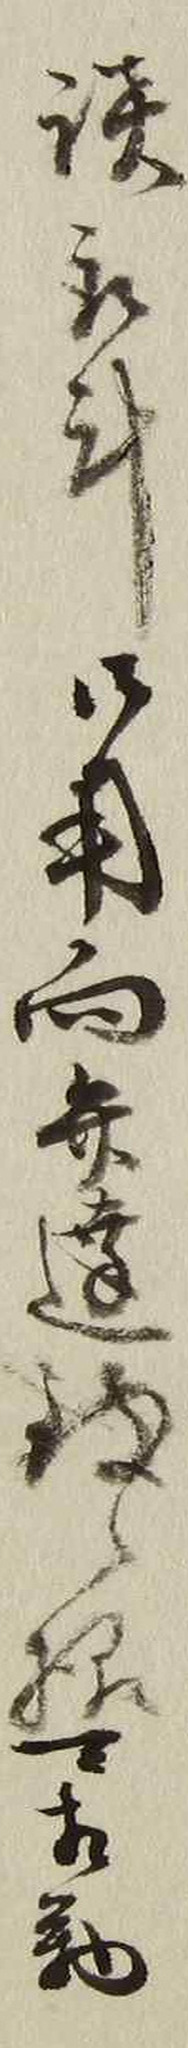談取計御用向弁達致候様可相勤
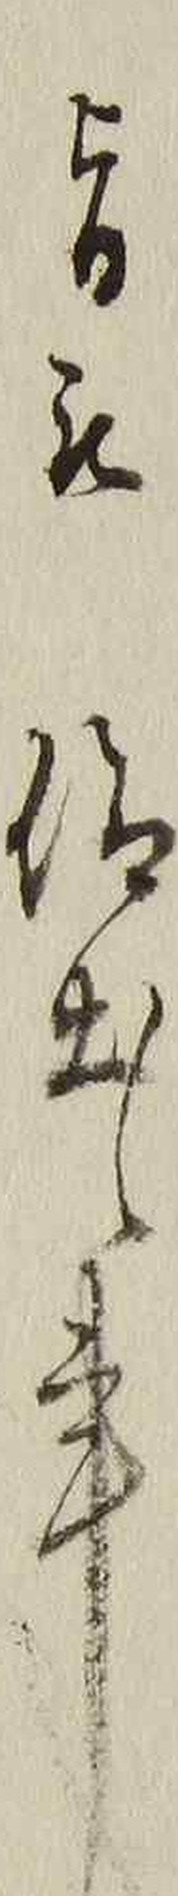旨被仰出候事
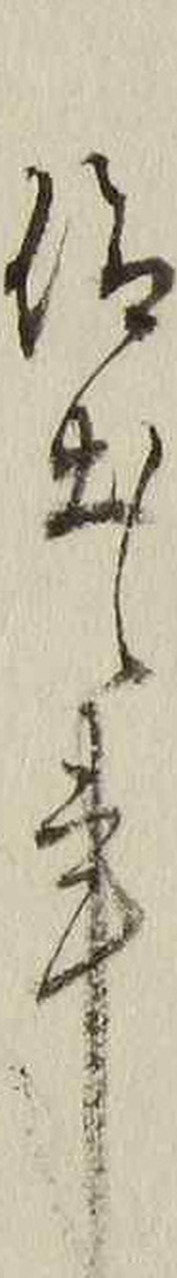仰出候事
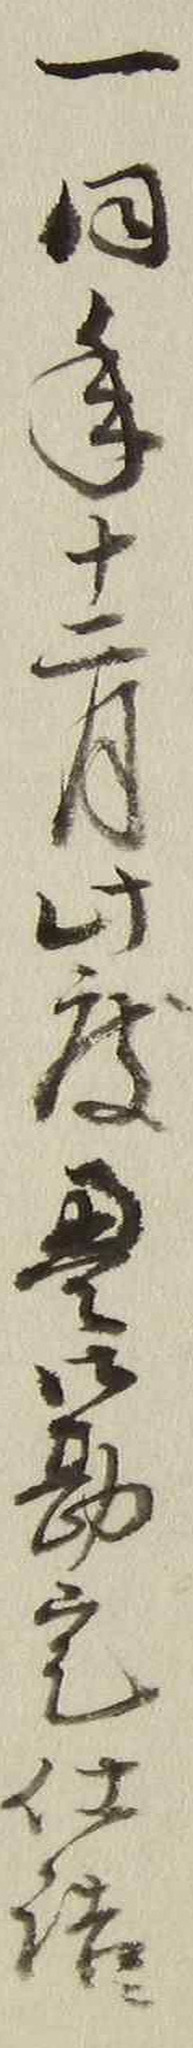一同年十二月此度畳御勘定仕詰ニ
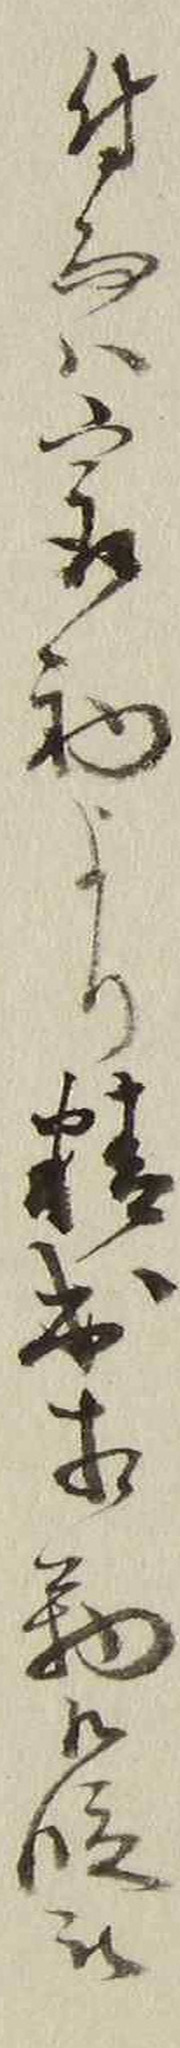付而ハ最初より精出相勤候段被
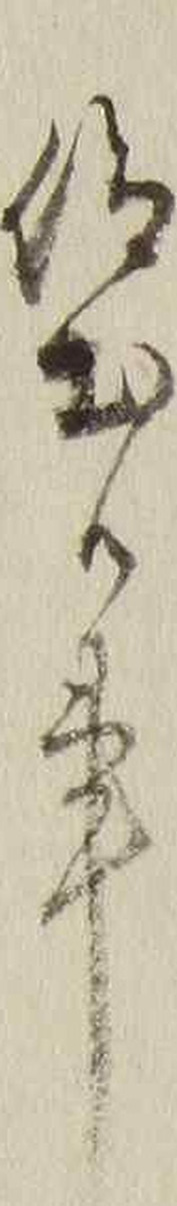仰出候事
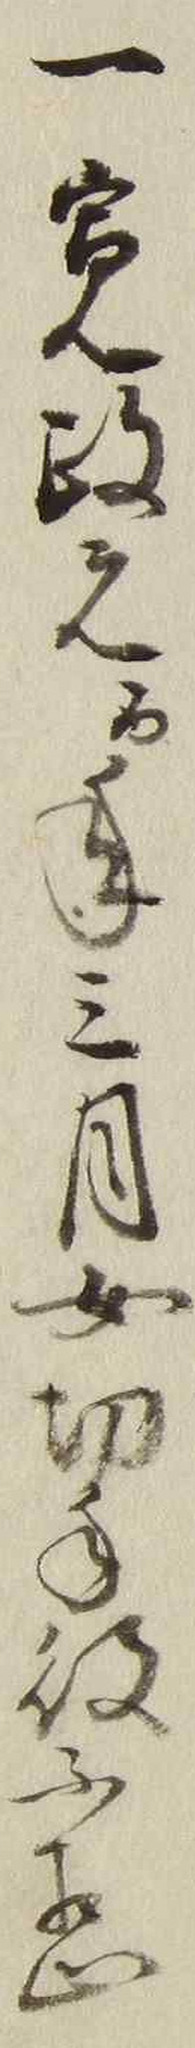一寛政元酉年三月女切手役不相止
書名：諸士系譜　巻之36　は之部4
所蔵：会津若松市立会津図書館
